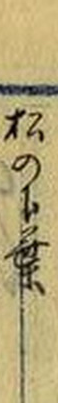松の下葉
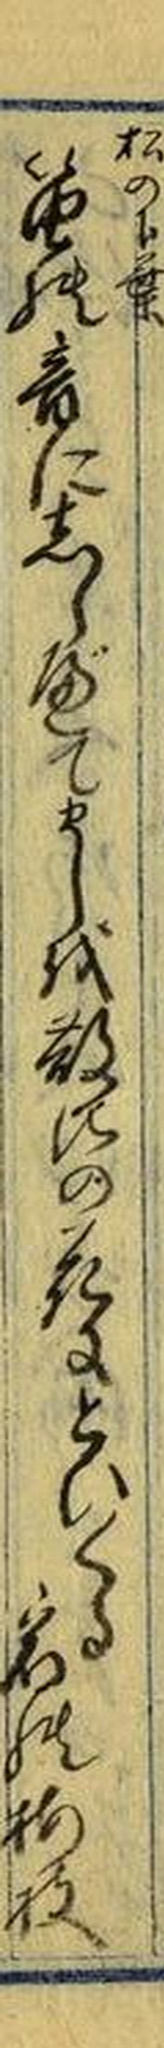笛の音にしらべてましを散比の花にとひくる宿の梅枝
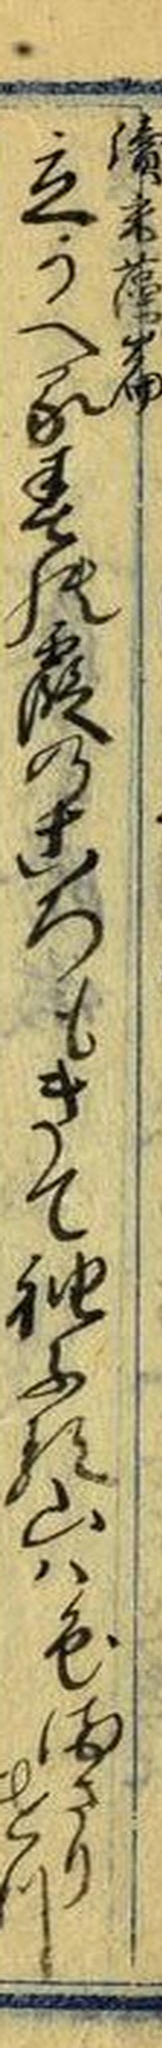立うへる春の霞のころもきて袖ふる山は色まさりけり
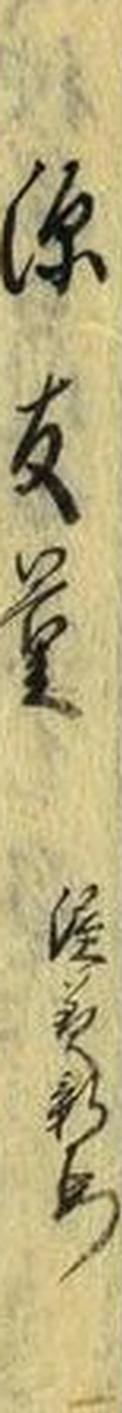源友量渥美新右衛門
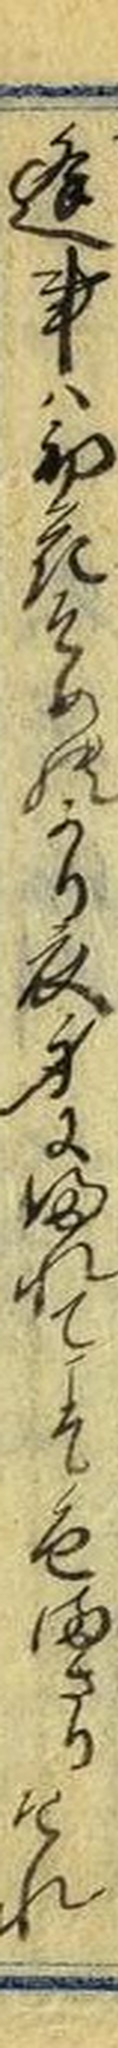逢事は初花そめのかり衣身にふれてこそ色まさりけれ
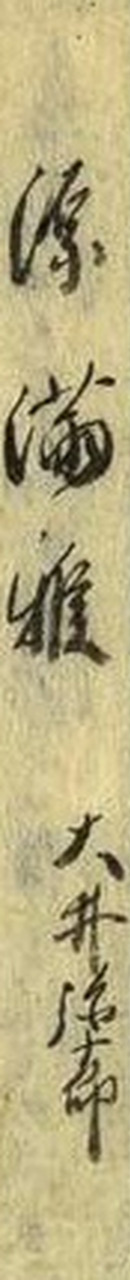源満雅大井弥太郎
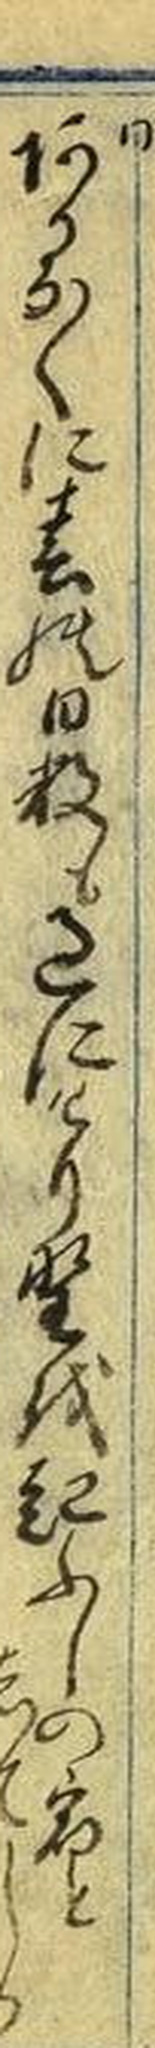あかなくに春の日数も過にけり野を起ふしの宿としてしか
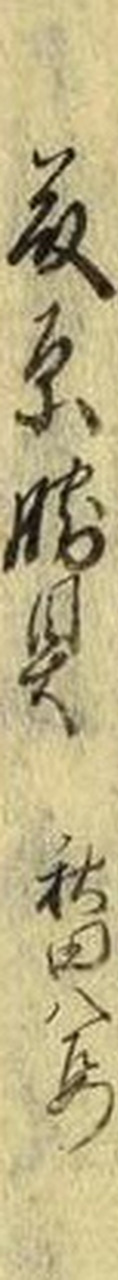藤原勝具秋田八左衛門
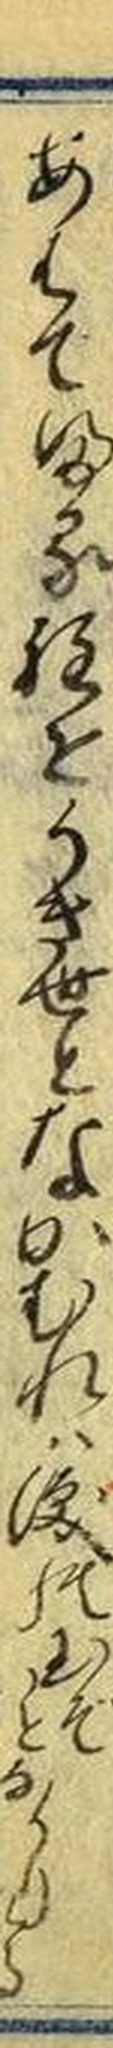あはてふる程をうき世となかむれは涙の玉ぞいとなかりける

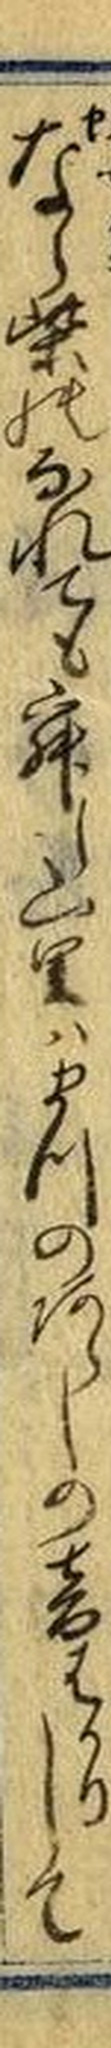なら柴のなれても寂し山里はまつのあらしの音はかりして
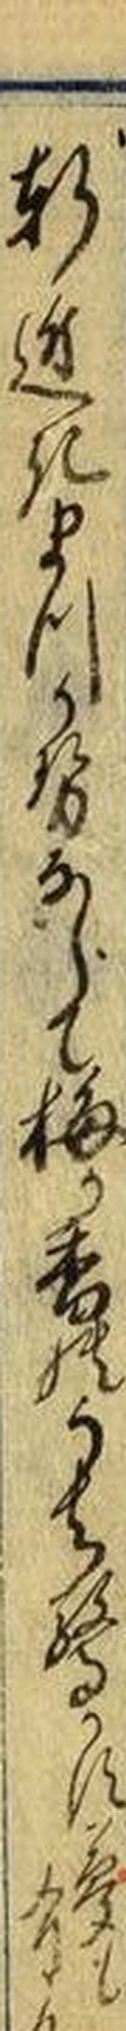軒近きまつかせならて梅か香のうち驚かす夢も有けり
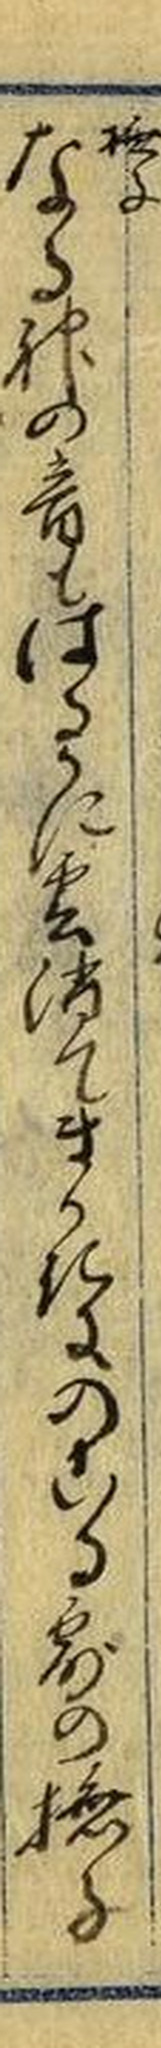なる神の音もはるかに雲消てまかきにのこる露の撫子
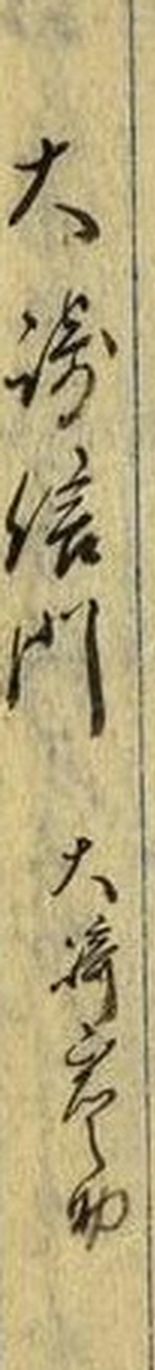大崎信門大崎岩之助
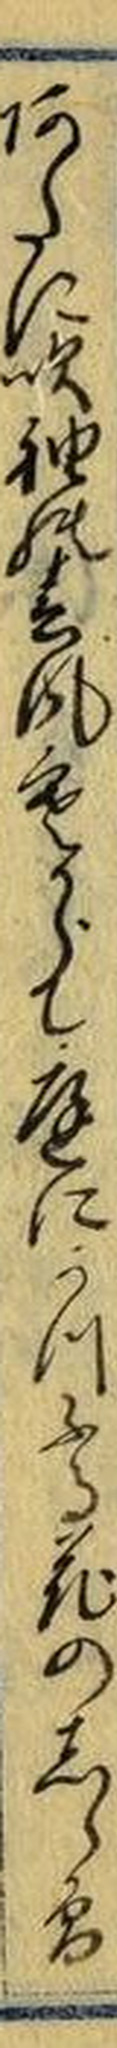あたに吹袖の春風寒からて庭にうつふる花のしら雪
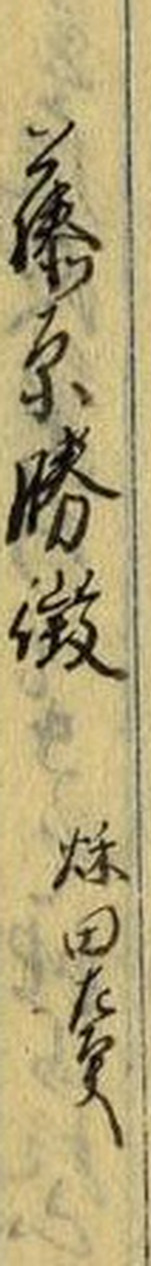藤原勝徴秋田左太夫
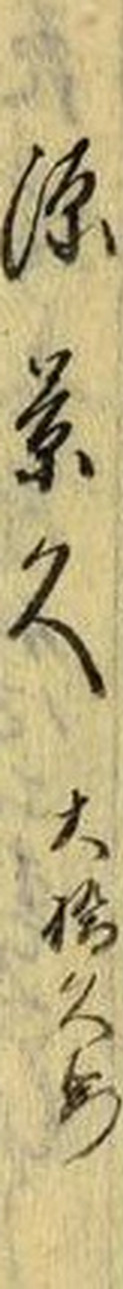源景久大橋久左衛門
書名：温古集 三巻
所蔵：福井県文書館 Fukui Prefectural Archives
